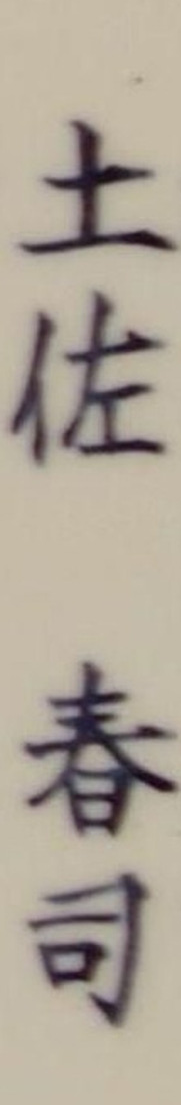土佐春司
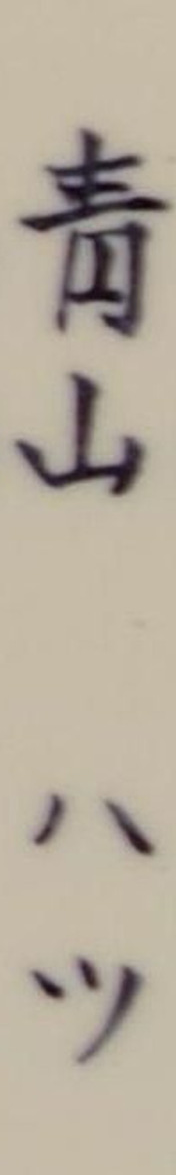青山ハツ
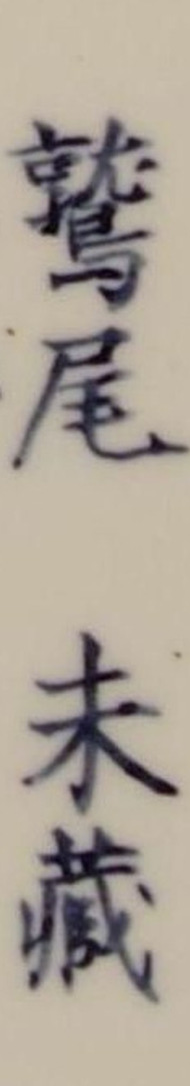鷲尾未蔵
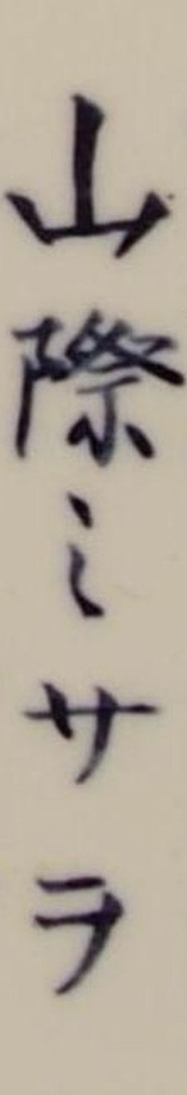山際ミサヲ
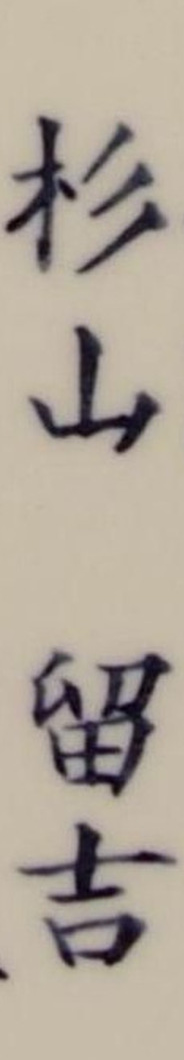杉山留吉
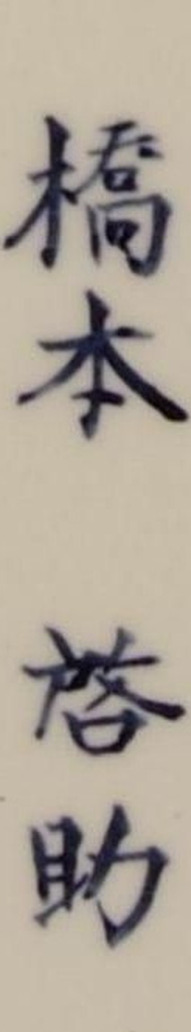橋本啓助
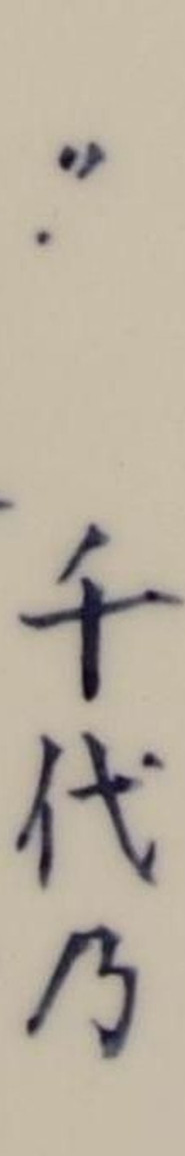千代乃
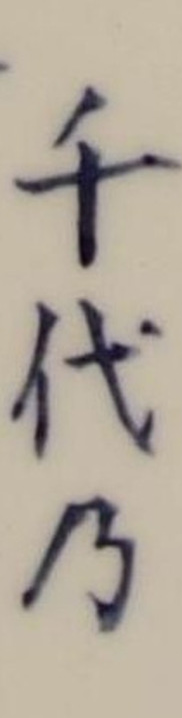千代乃
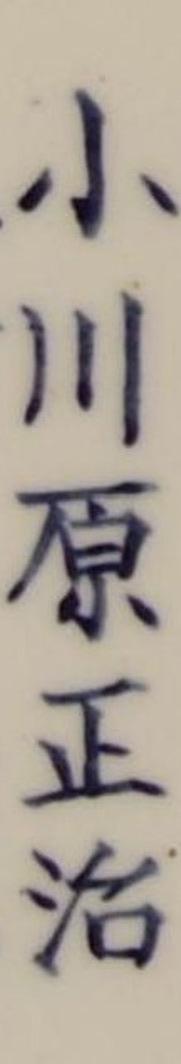小川原正治
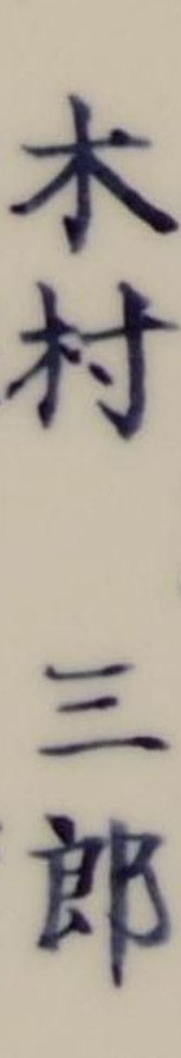木村三郎
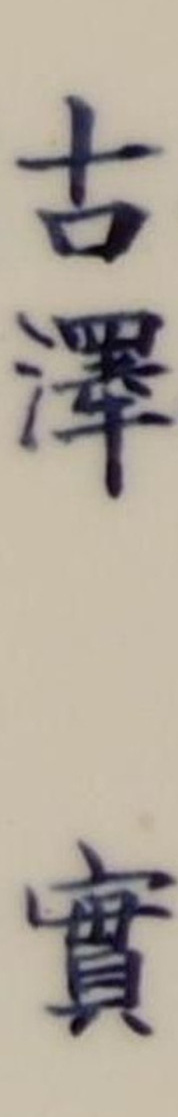古澤実
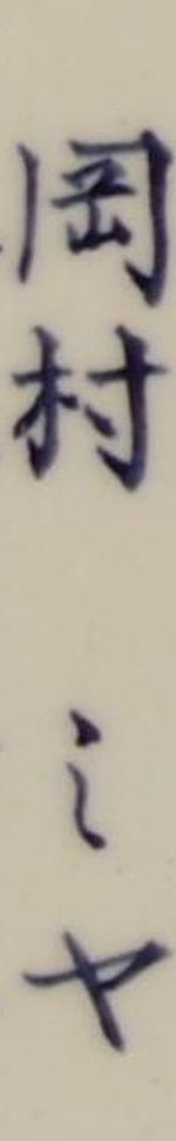岡村ミヤ
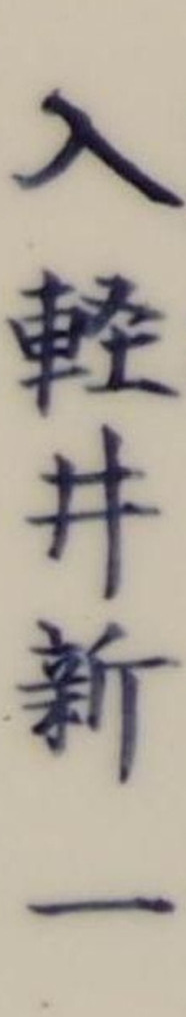入軽井新一

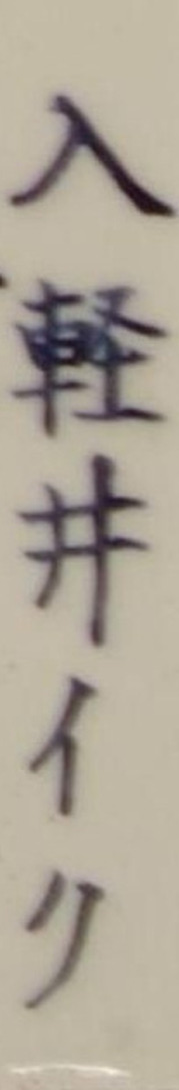入軽井イク
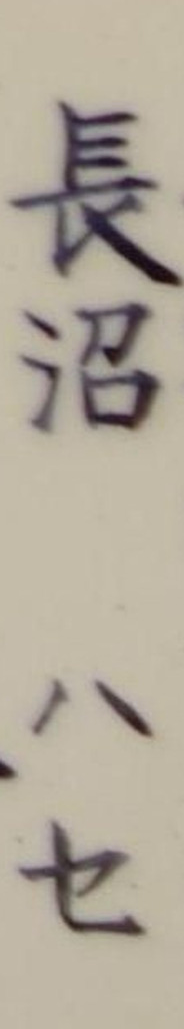長沼ハセ
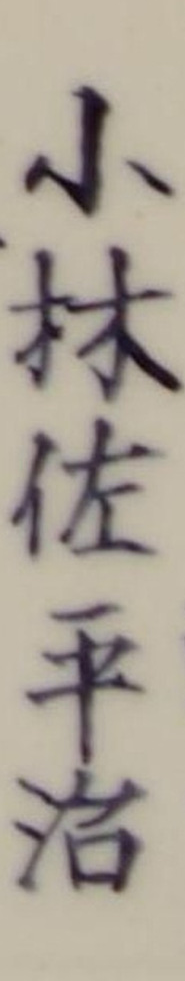小林佐平治
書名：M~S
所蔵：高野山金剛峯寺
